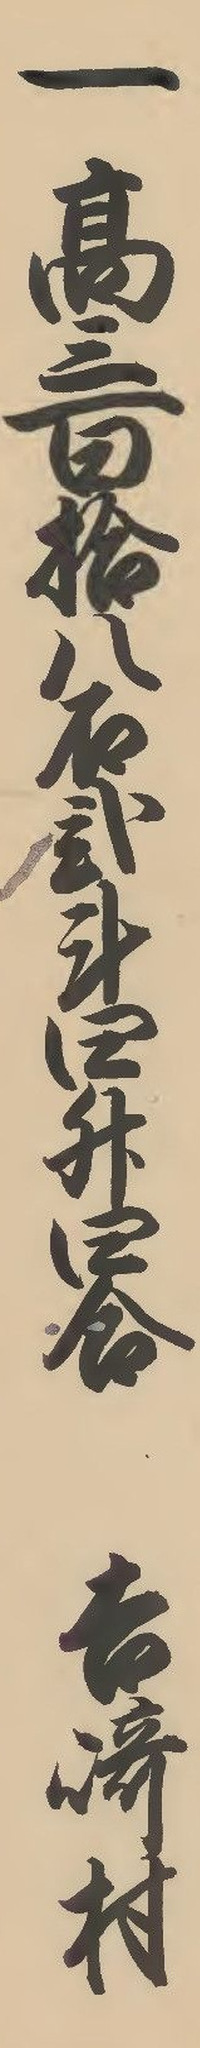一髙三百拾八石弐斗四升四合吉崎村

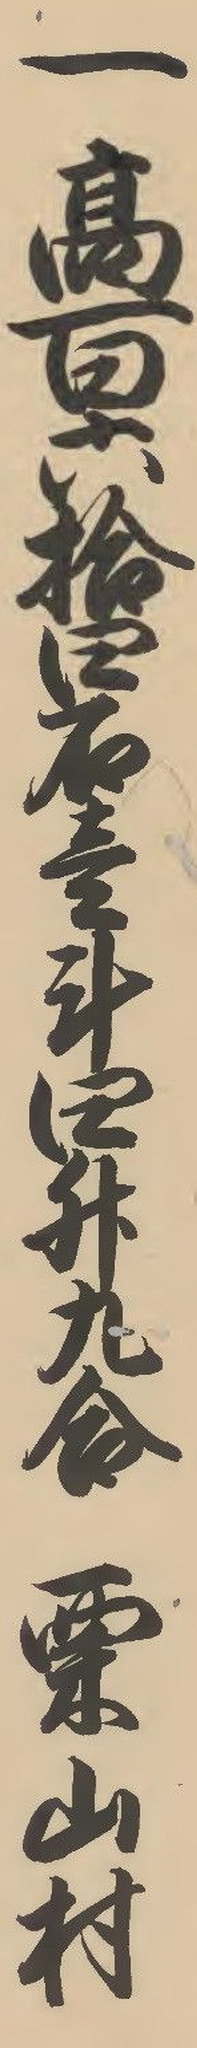一髙百六拾四石壱斗四升九合栗山村
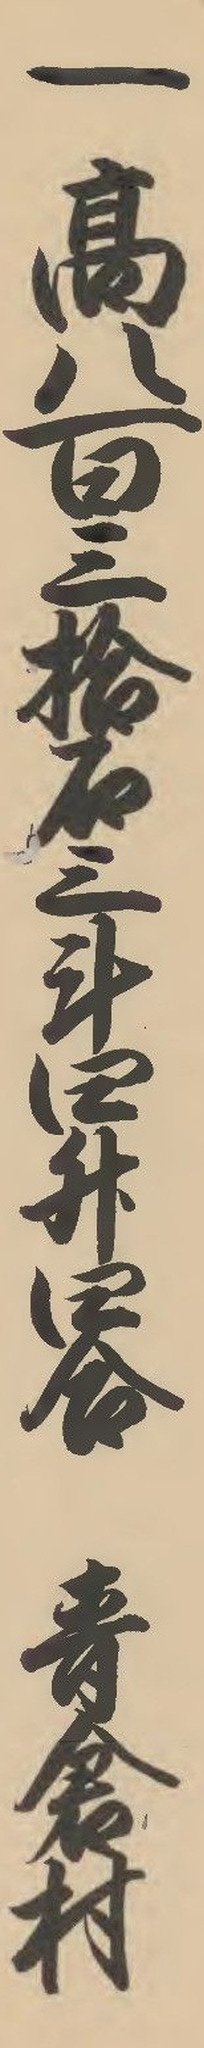一髙八百三拾石三斗四升四合青倉村
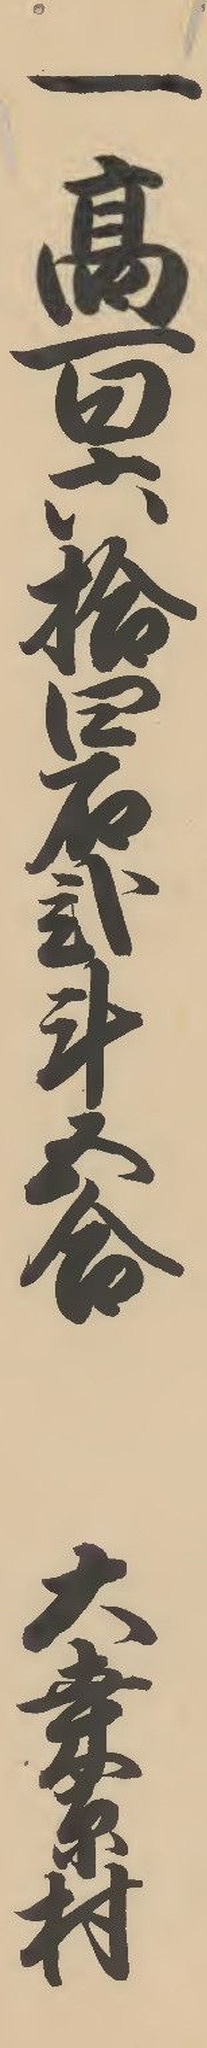一髙百六拾四石弐斗五合大桑原村
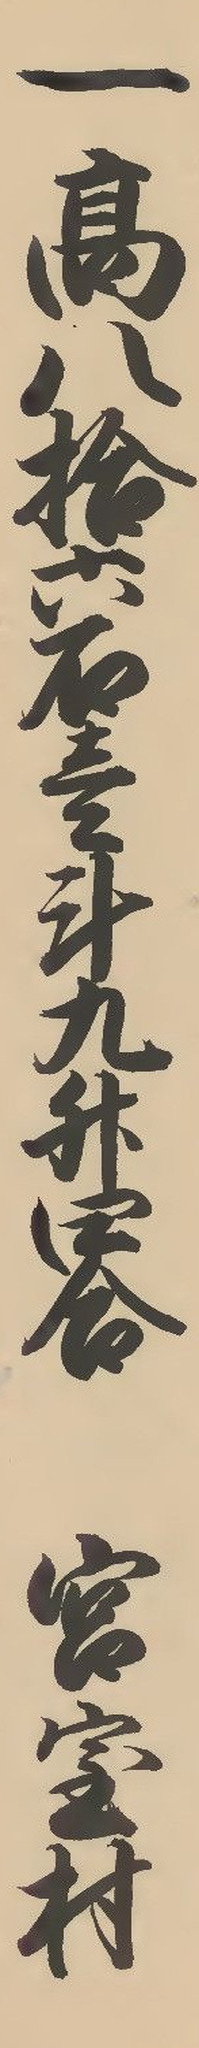一髙八拾六石壱斗九升四合宮室村
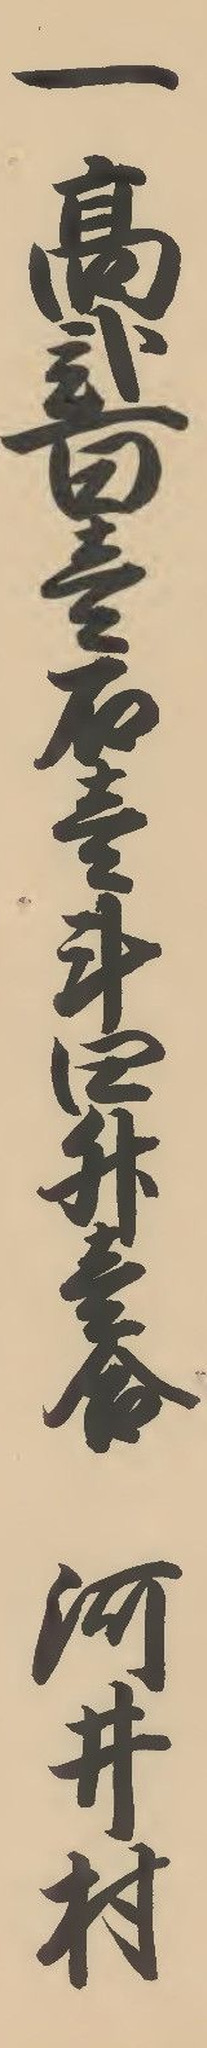一髙弐百壱石壱斗四升壱合河井村
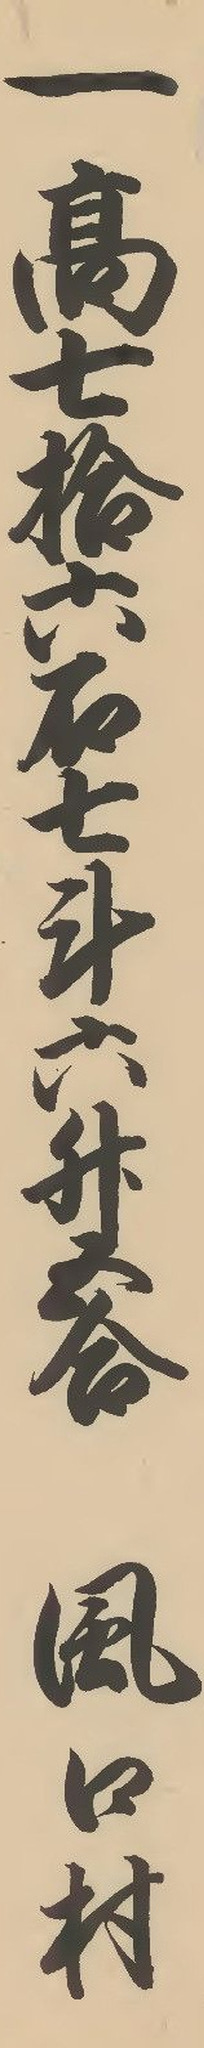一髙七拾六石七斗六升五合風口村
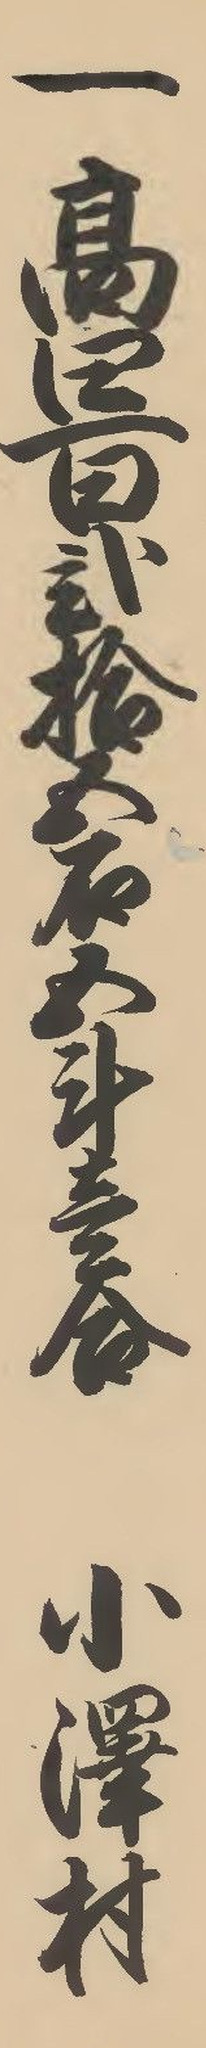一髙四百弐拾五石五斗壱合小澤村
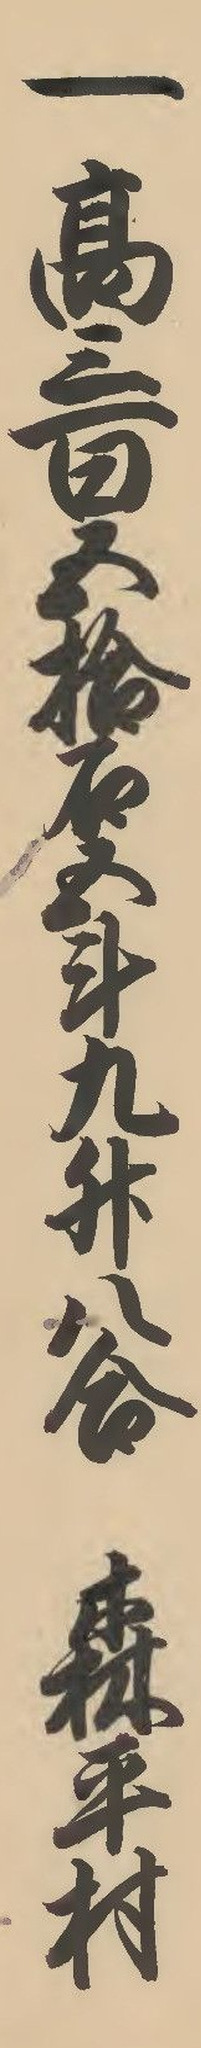一髙三百五拾石五斗九升八合森平村

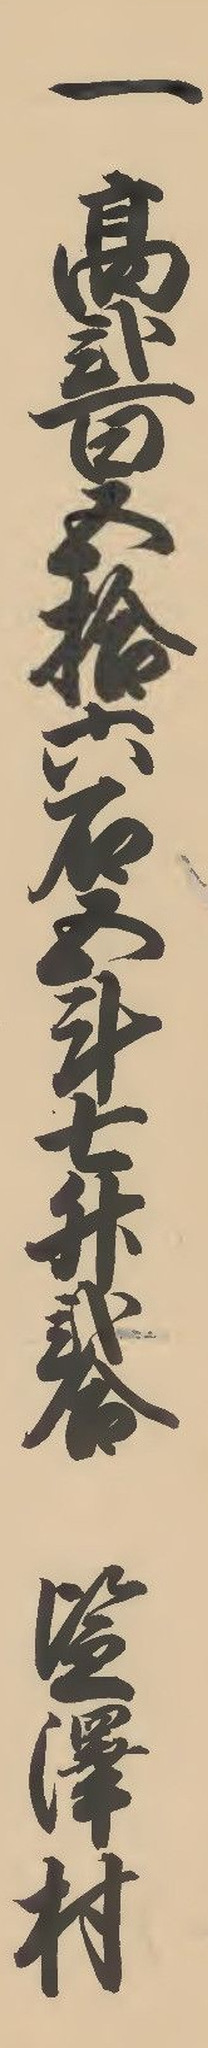一髙弐百五拾六石五斗七升弐合塩澤村
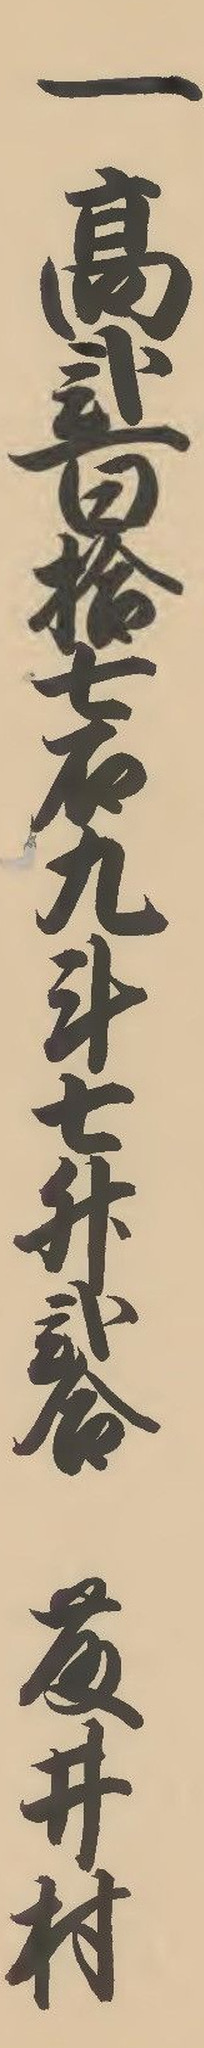一髙弐百拾七石九斗七升弐合藤井村
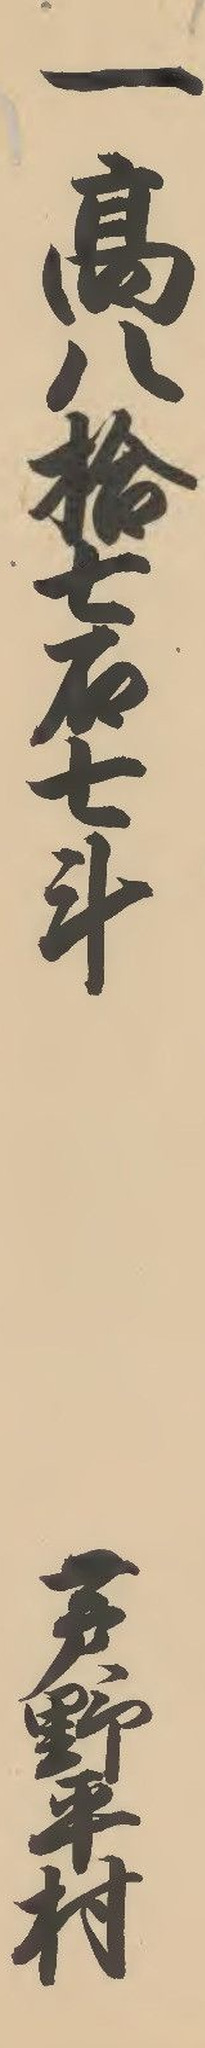一髙八拾七石七斗芦野平村
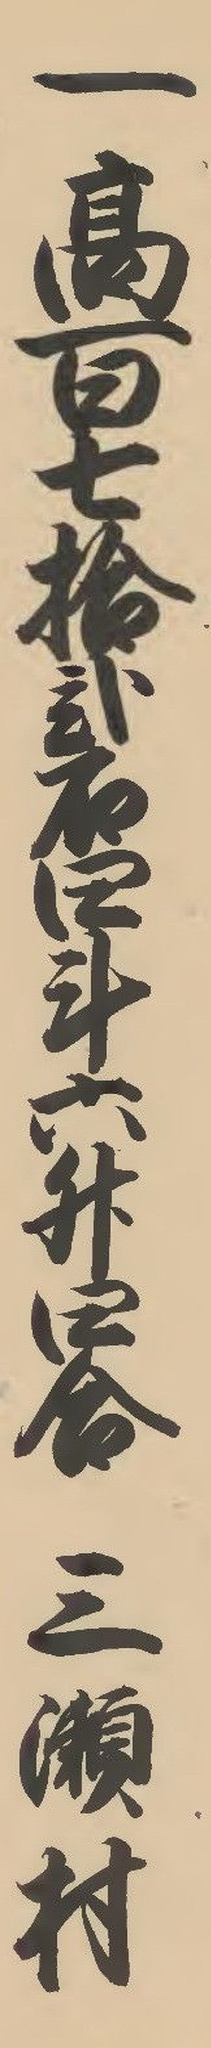一髙百七拾弐石四斗六升四合三瀬村
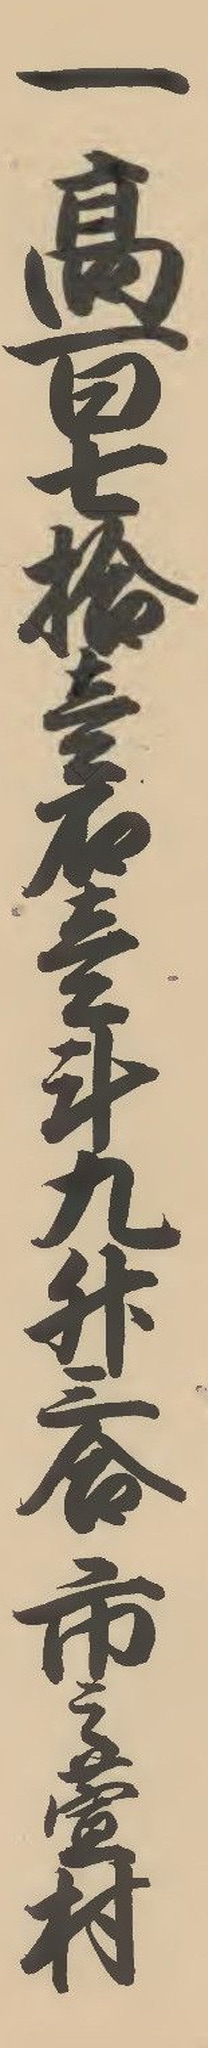一髙百七拾壱石壱斗九升三合市之萱村
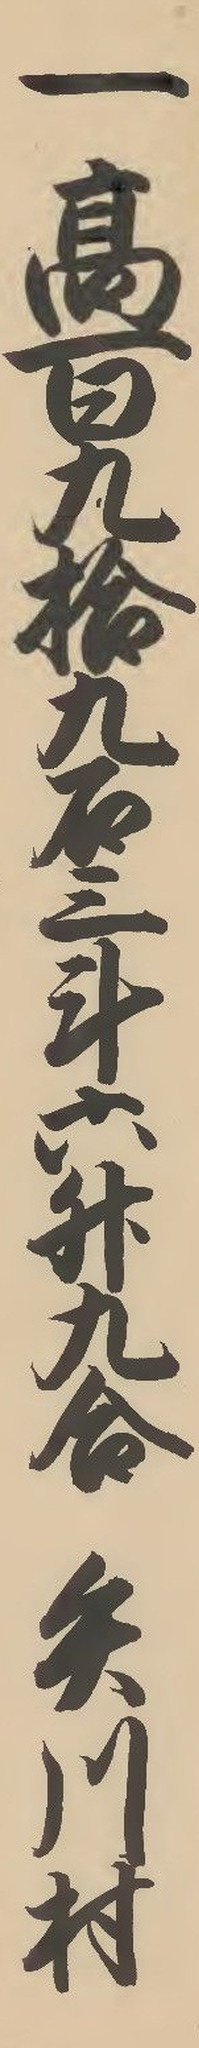一髙百九拾九石三斗六升九合矢川村
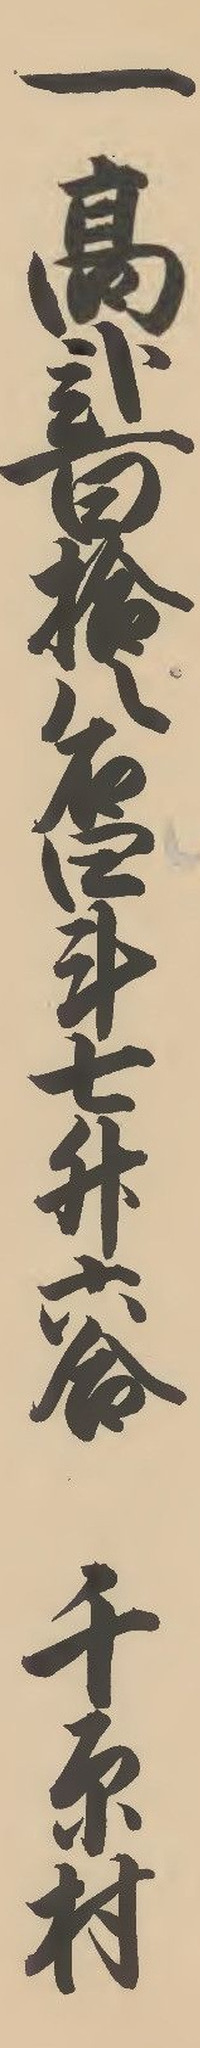一髙弐百拾八石四斗七升六合千原村
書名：上野国郷帳
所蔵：国立公文書館 National Archives of Japan
